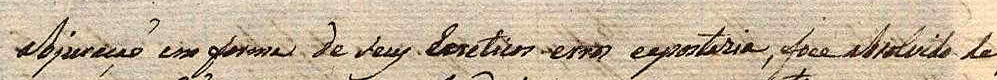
abjuraçaõ em forma de seus hereticos erros e apostazia, foce absolvido de
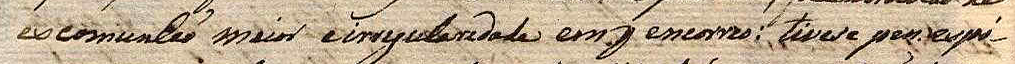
excomunhaõ maior, e irregularedade em q̄ encorreo: tivese pen. expi
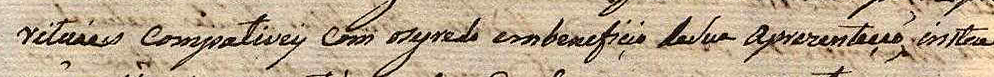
rituaes compativeis com o segredo em beneficio da sua aprezentaçaõ, instru
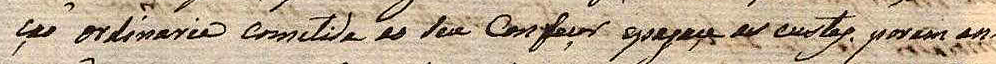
ção ordinaria cometida ao seu Confeçor e pagace as custas. porem an
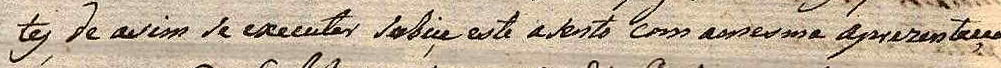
tes de asim se executar subice este asento com a mesma aprezentaçaõ
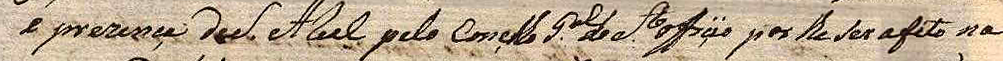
e prezença de S. A Real pelo Concelho G.al do S.to officio por lhe ser afeto na
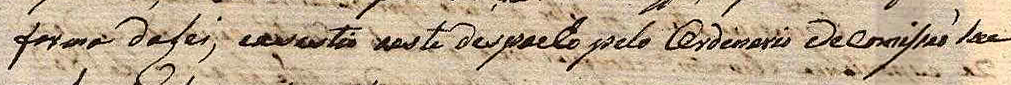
forma da Lei, e asestio a este despacho pelo Ordinario de comissaõ sua
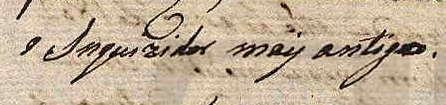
e Inquizidor mais antigo.
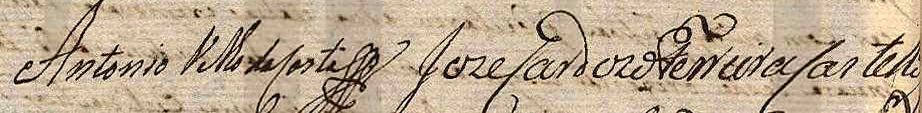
Antonio Velho de Costa Joze Cardozo Ferreira Castello
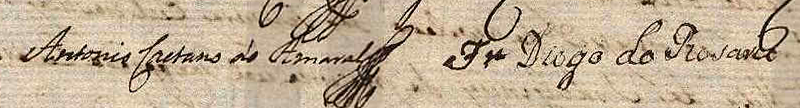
Antonio Caetano do Amaral Fr Diogo do Rosario
